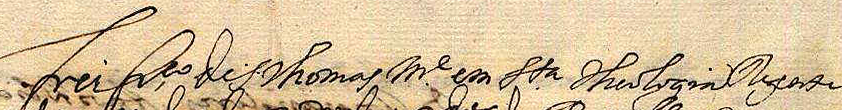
frei fr.co de s. thomas m.e em S.ta theologia Regente
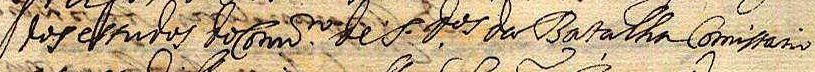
dos estudos do Conu.to de S. D.os da Batalha Comissario
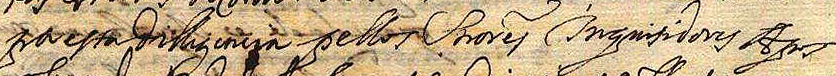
pa esta dilligencia pellos Snorēs Inquisidores Apos
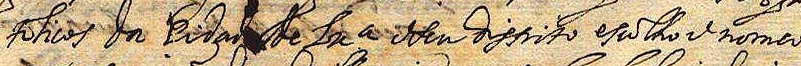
tolicos da cidade de Lxa e seu distrito escolho e nomeo
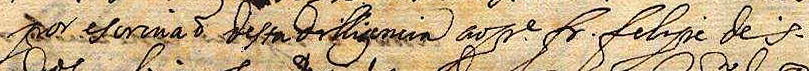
por escriuaõ desta dilligencia ao pe fr. felipe de s.
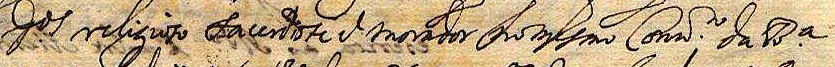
D.os religioso sacerdote e morador no mesmo Conu.to da B.a
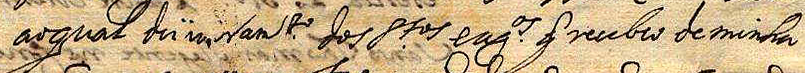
ao qual dei iuram.to dos S.tos eugos q̄ recebeo de minha
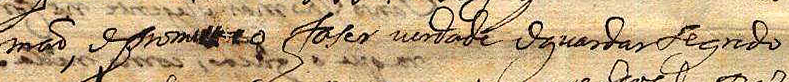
maõ, e prometteo faser uerdade e guardar segredo
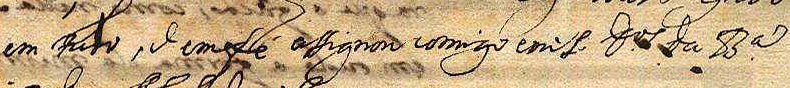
em tudo, e em fé assignou comigo em s. D.os da B.a
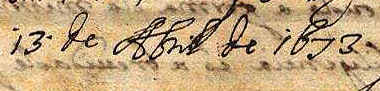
i3. de Abril de i673
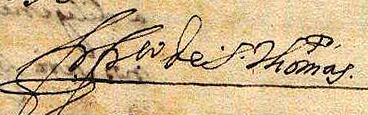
fr fr.co de s. thomas.
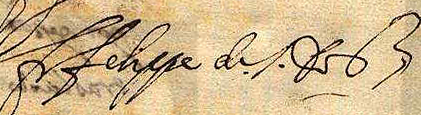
fr felippe de s. Dos̄
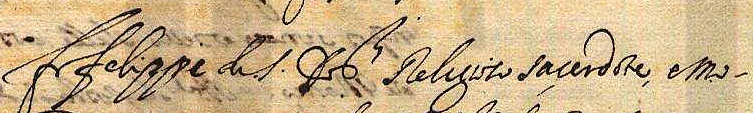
fr felippe de s. Dos. Religioso sacerdote, e mo
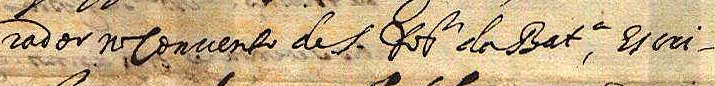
rador no Conuento de S. Dos̄ da Bata, Escri
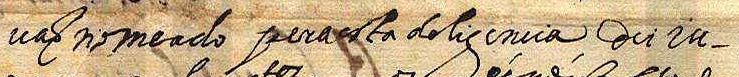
uaõ nomeado pera esta deligencia dei iu
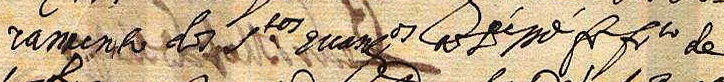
ramento dos Stos Euangos ao Pe Me fr frco de
